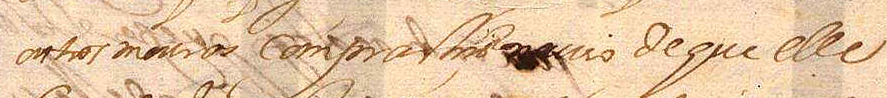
outros mouros comprar hū nauio de que elle
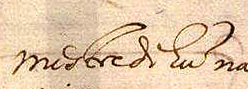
mestre de hū na
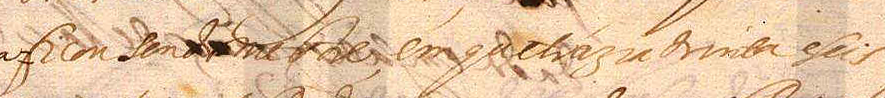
ficou sendo mestre, em que trazia trinta e seis
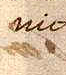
uio
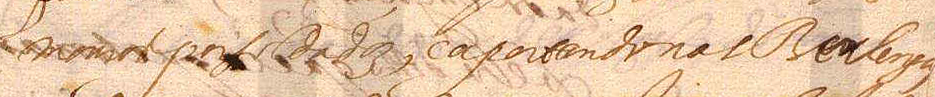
mouros por soldadoz, e aportando nas Berlengas
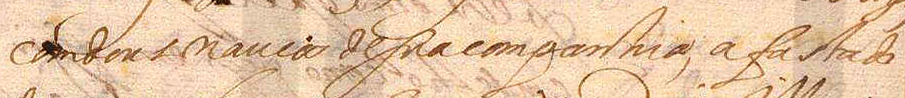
com dous nauios de sua companhia, afastado
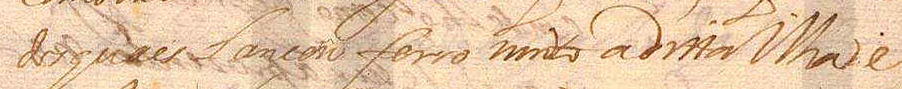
dos quaes Lançou ferro iunto a ditta Ilha e
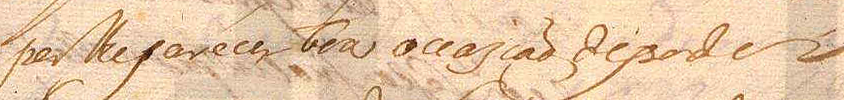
por lhe parecer boa occaziaõ de poder
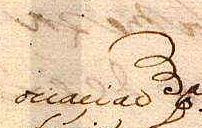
occaciaõ pa.
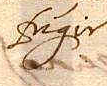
fugir
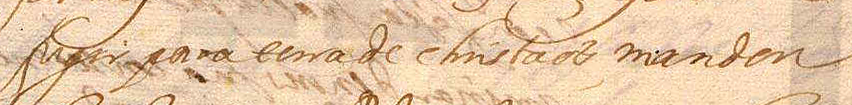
fugir para terra de christaõs, mandou
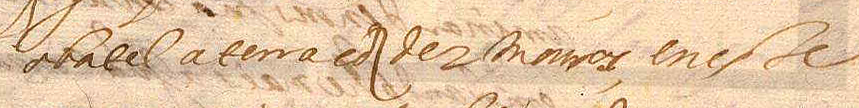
o batel a terra cō dez mouros, e neste
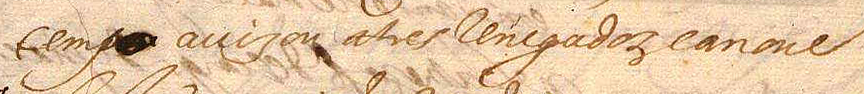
tempo auizou a tres Renegados e a noue
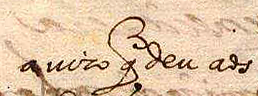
auizo q̄ deu aos
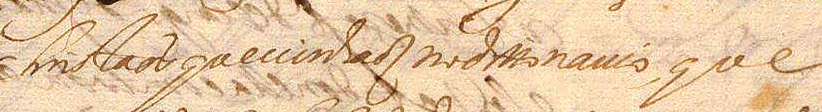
christaõs que uinhaõ no ditto nauio, que
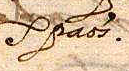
Xpaõs.
